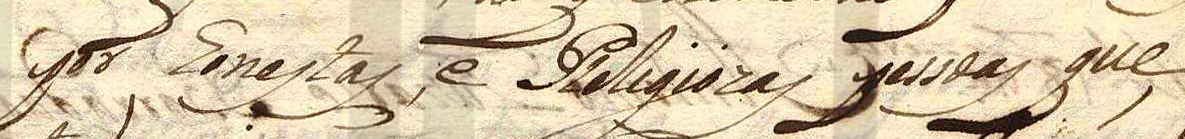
por honestas, e Religiozas pessoas que
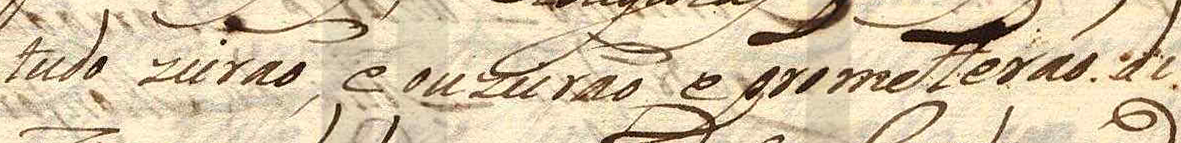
tudo viraõ, e ouvirão, e prometterão. di
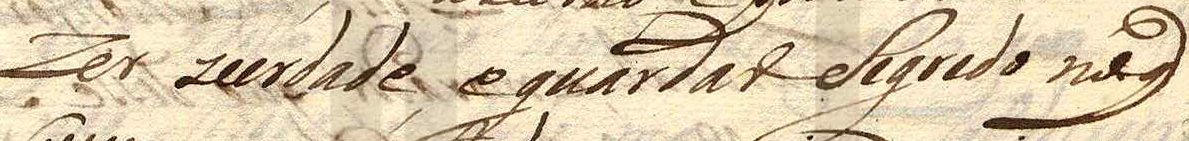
Zer verdade e guardar Segredo no q̄
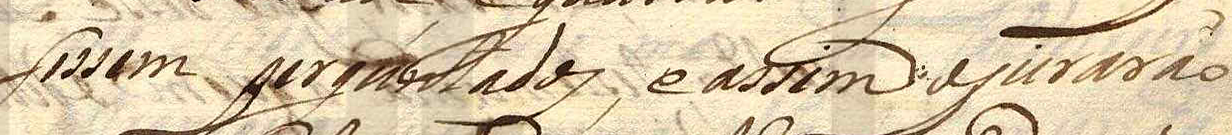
fossem perguntados, e assim o jurarão
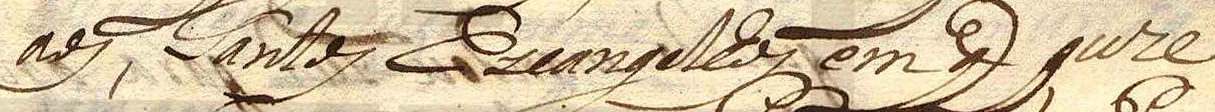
aos Santos Evangelhos em q̄ puze
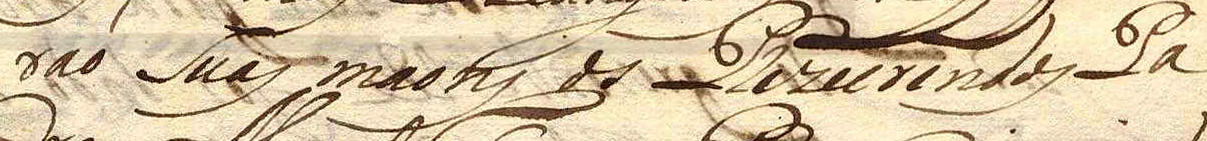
raõ Suas maons os Reverendos Pa
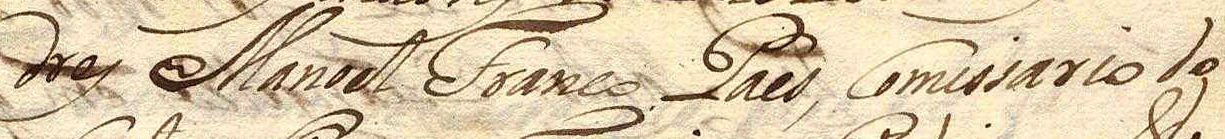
dres Manoel Franco Paes, Comissario do
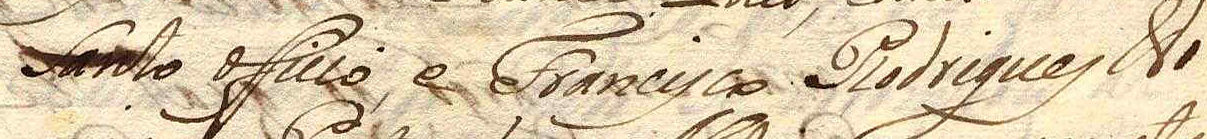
Santo officio, e Francisco Rodrigues No
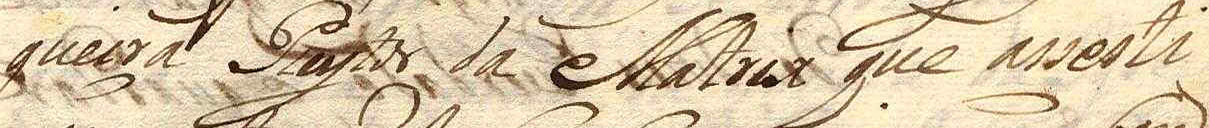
gueira Reytor da Matrix que assesti
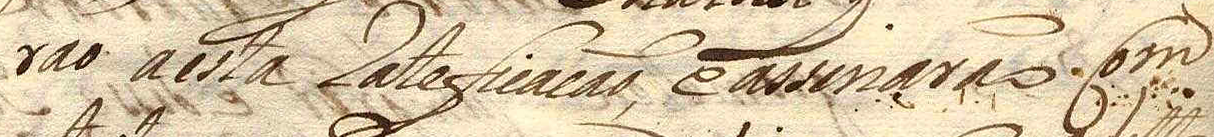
raõ a esta Rateficaçaõ, e assinarão. Com
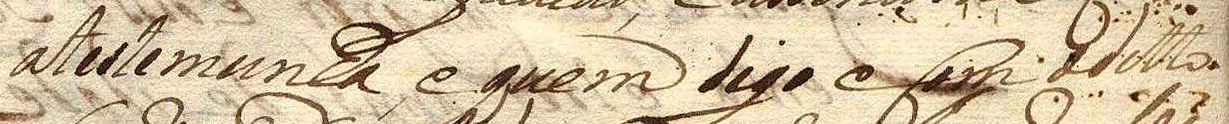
a testemunha, e quem digo e Com o ditto
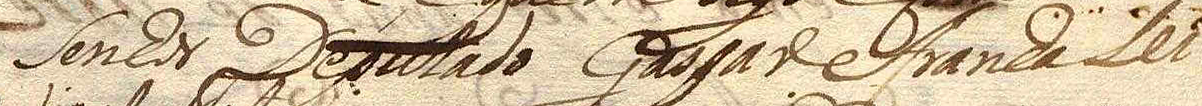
Senhor Deputado Gaspar Aranha Vi
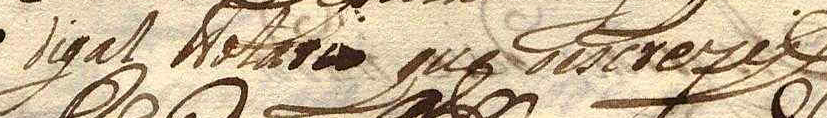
digal Notario que o escrevj
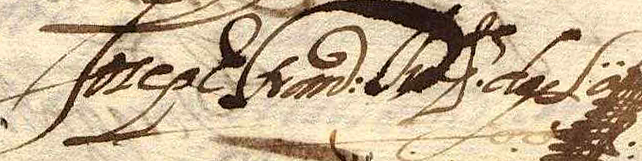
Jozeph Franco: I_.te de Sa
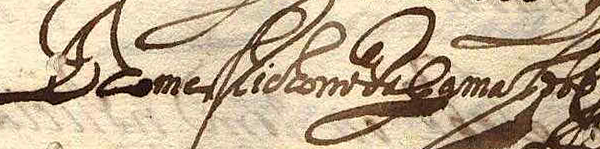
Thome Chichorro da Gama Lobo
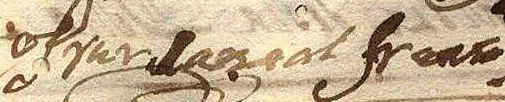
o Pror Manoel franco
